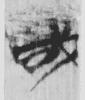或
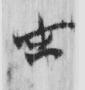才
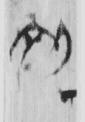{它刀}
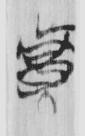貴
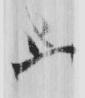之
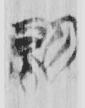則
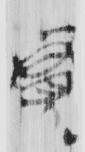貴
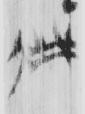俴
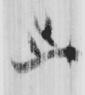之
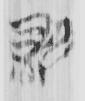則
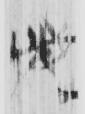俴
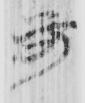可
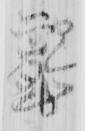{龍心}
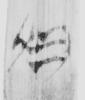於
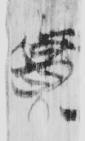貴
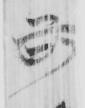可
